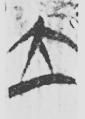立
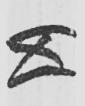五
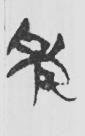年
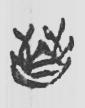晉
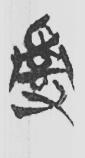𤔔
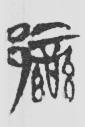{邑䜌}
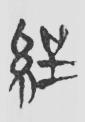{糸呈}
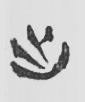出
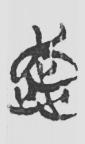奔
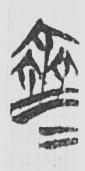齊=
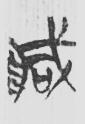戕
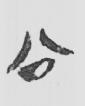公
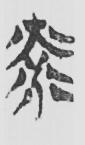光
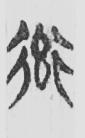率
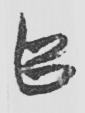𠂤
